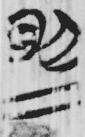則（則）
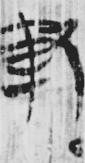○（犯）
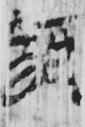䎽（聞）
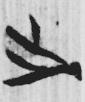之
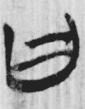曰
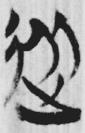從
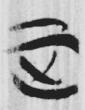正（政）
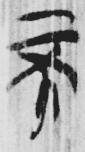不
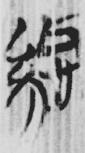○（治）
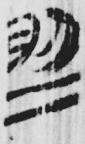則（則）
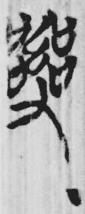○（亂）
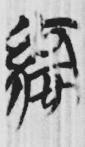○（治）
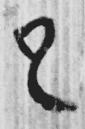已
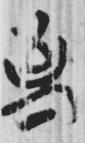至
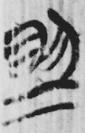則
